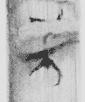茍
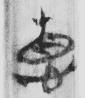惪
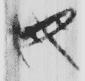母
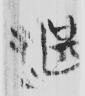湛
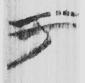于
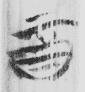酉
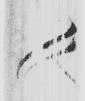民
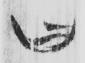曰
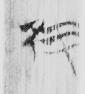隹
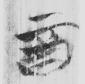酉
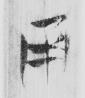甬
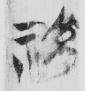{示兔}
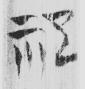祀
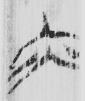亦
